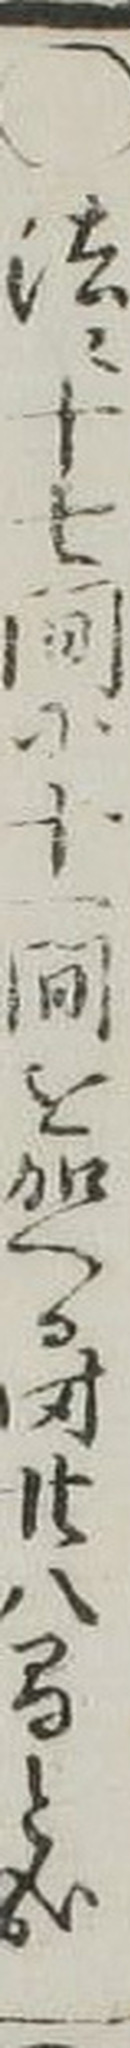○法に十七間に十一間を加へる時廿八間と成
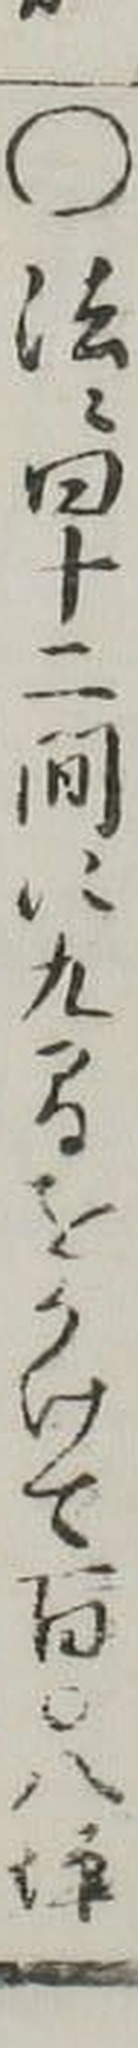○法に曰十二間に九間をかけて百〇八坪
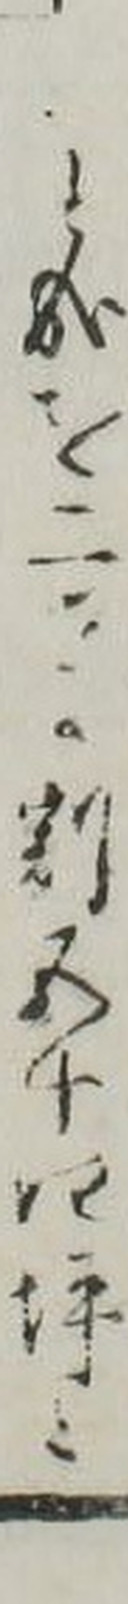九間と成を二ツに割五十四坪と
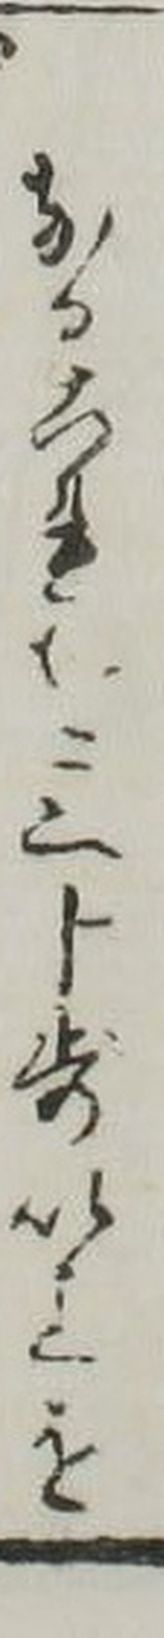間なるこれに三十歩以上を
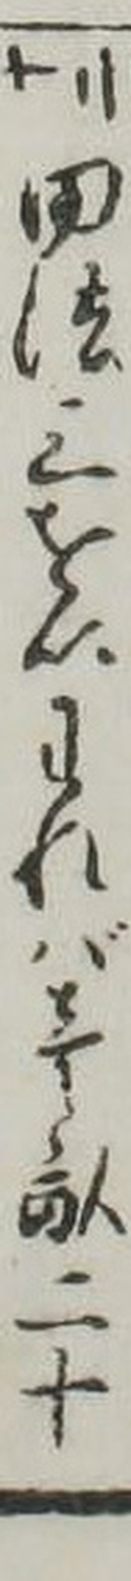二田法三を以われば壱畝二十
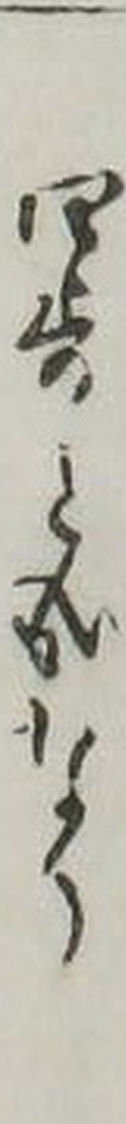十四歩と成なり
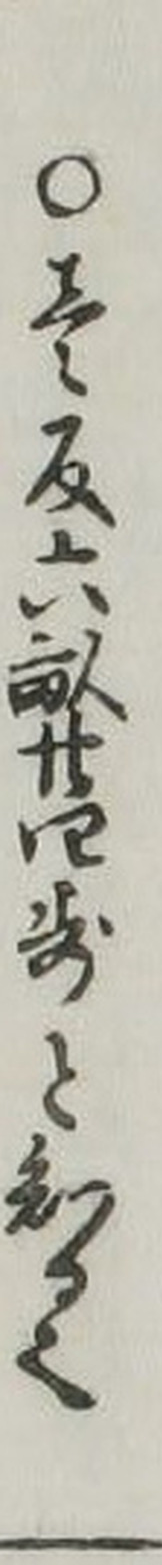○壱反六畝廿四歩と知る也
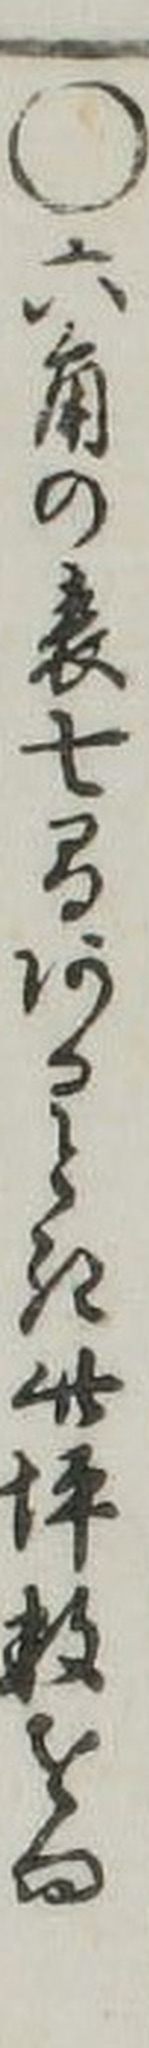○六角の表七間あるとき此坪数を問
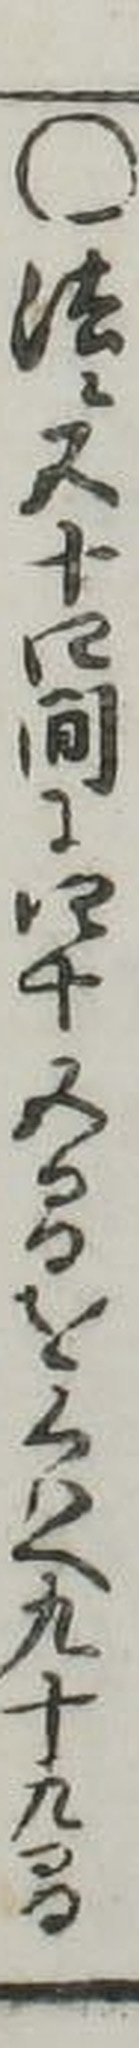○法に五十四間に四十五間をくはへ九十九間
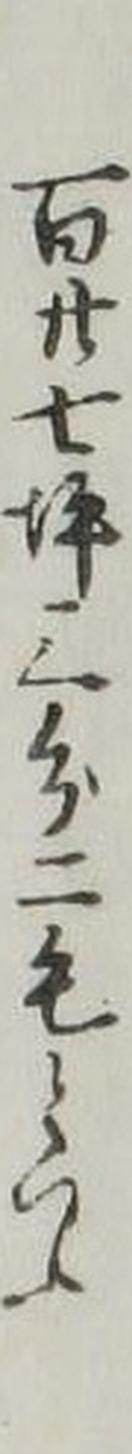百廿七坪三分二毛といふ
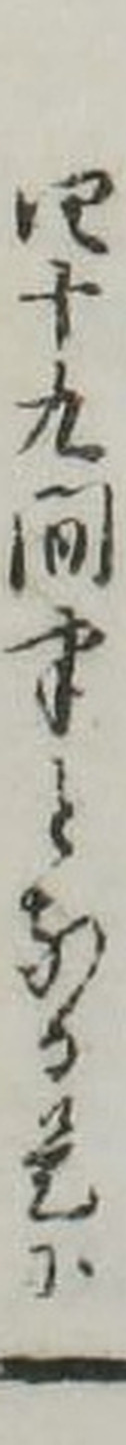間四十九間半となる是に
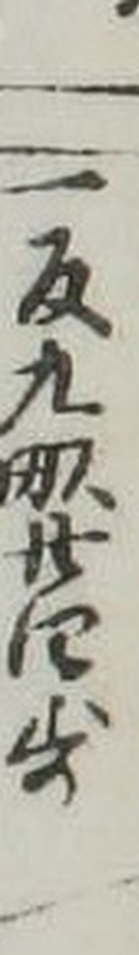一反九畝廿四歩と
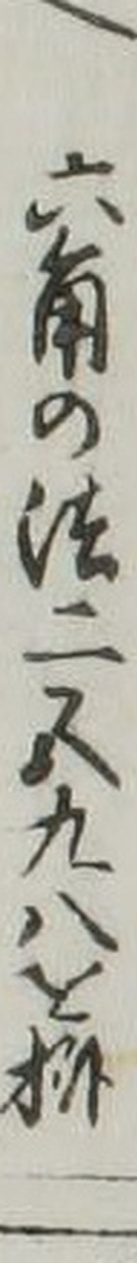六角の法二五九八を掛
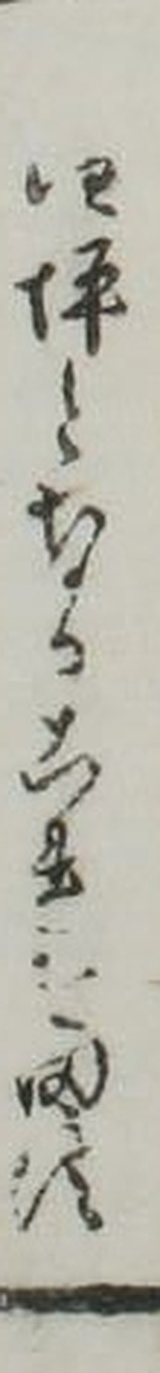十四坪となるこれを田法
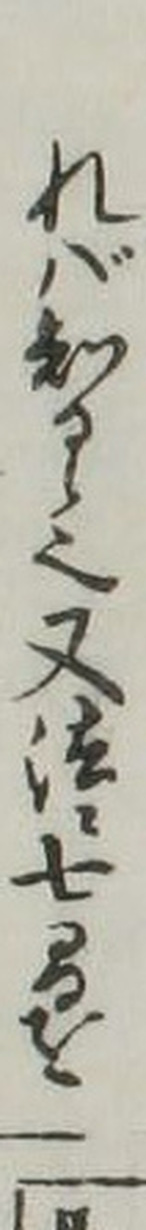同同れば知るゝ也又法に七間を
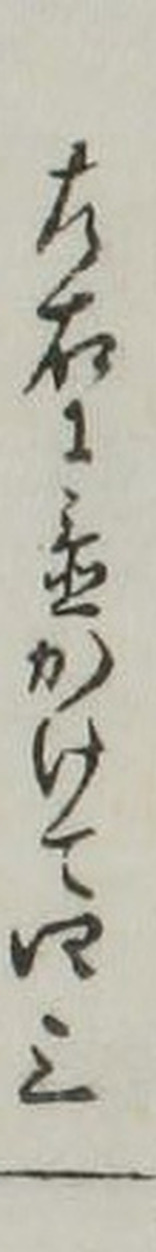同左右に置かけて四三
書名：宝玉塵劫記
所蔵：東京学芸大学教育コンテンツアーカイブ
